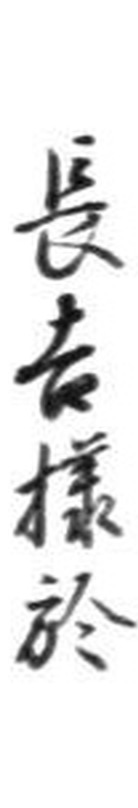長吉様於
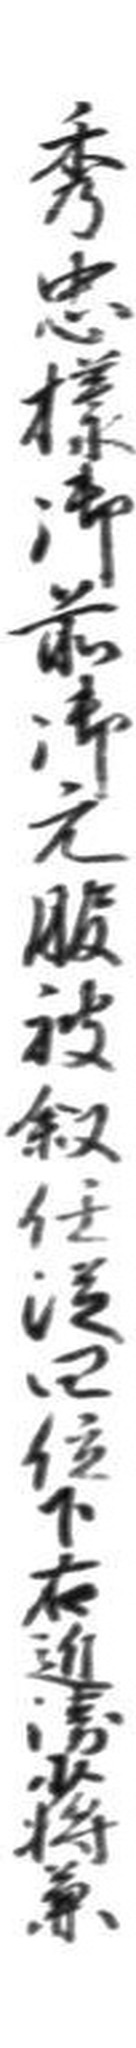秀忠様御前御元服被叙任従四位下右近衛少将兼
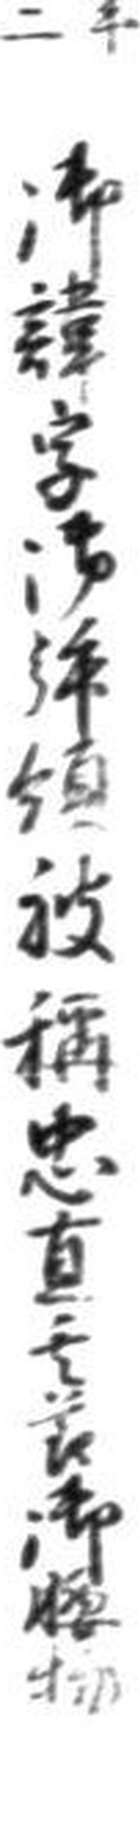十二御諱字御拝領被称忠直其節御腰物
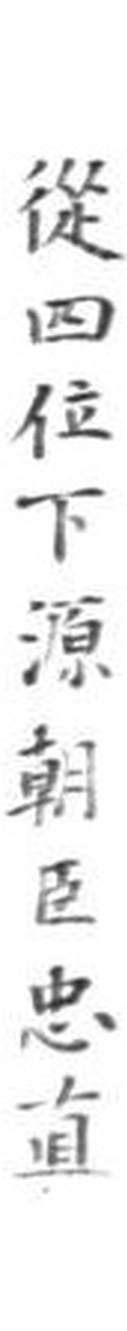従四位下源朝臣忠直

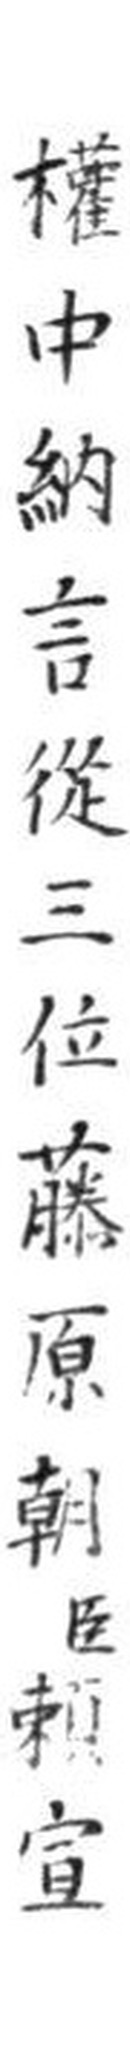権中納言従三位藤原朝臣頼宣
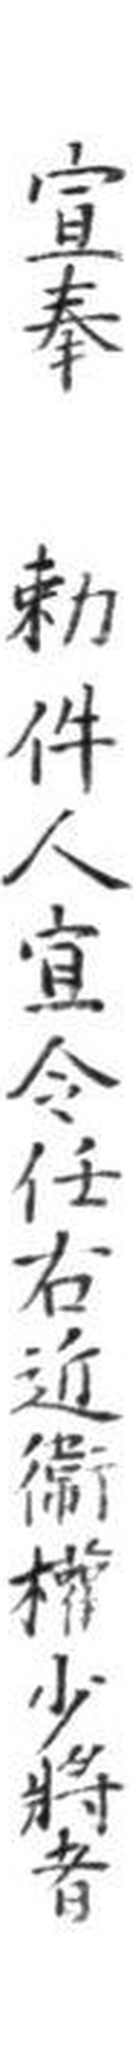宣奉勅件人宣令任右近衛権少将者
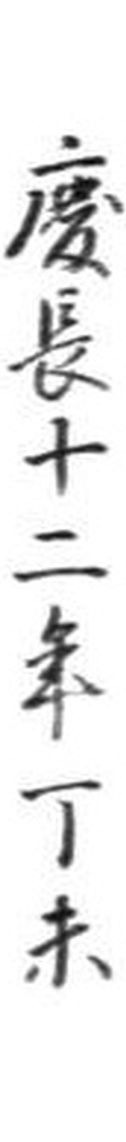慶長十二年丁未
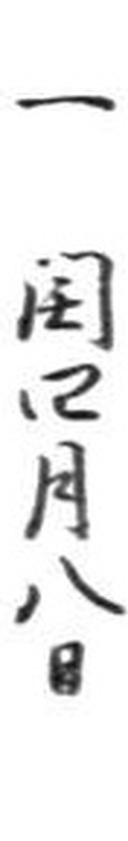一閏四月八日
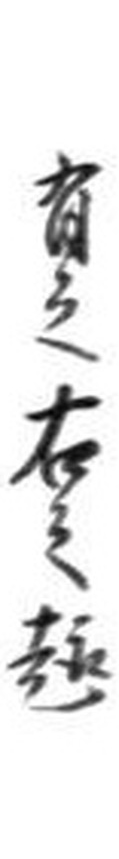有之右之趣
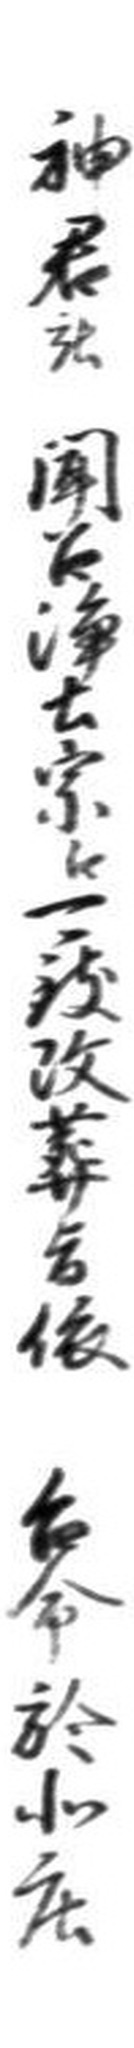神君被聞召浄土宗江可致改葬旨依台命於北庄
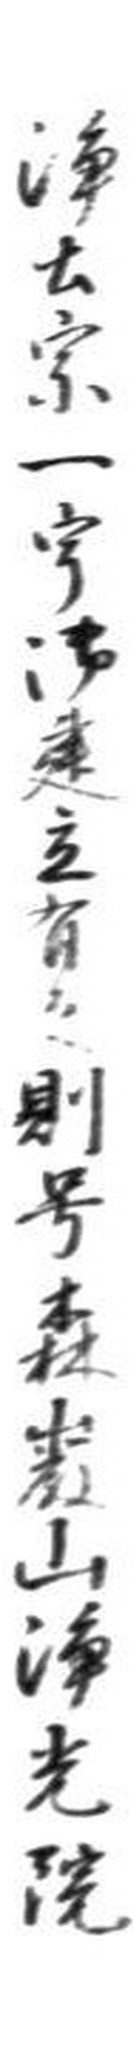浄土宗一宇御建立有之則号森厳山浄光院
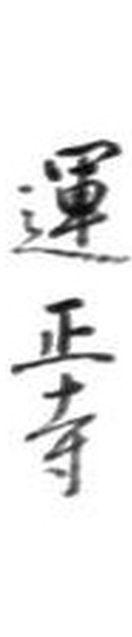運正寺
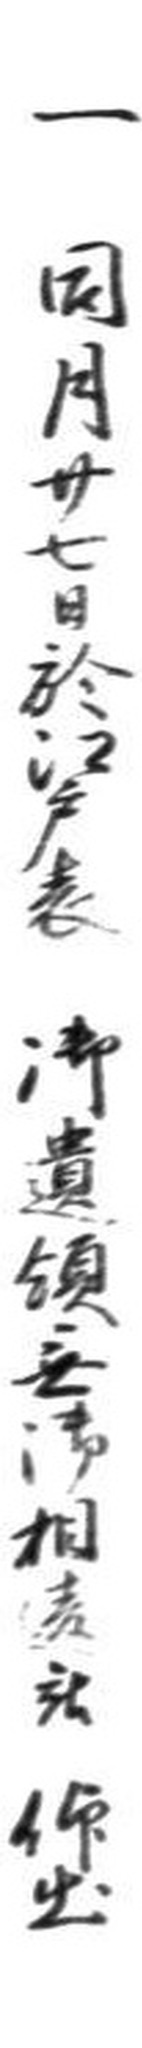一同月廿七日於江戸表御遺領無御相違被仰出

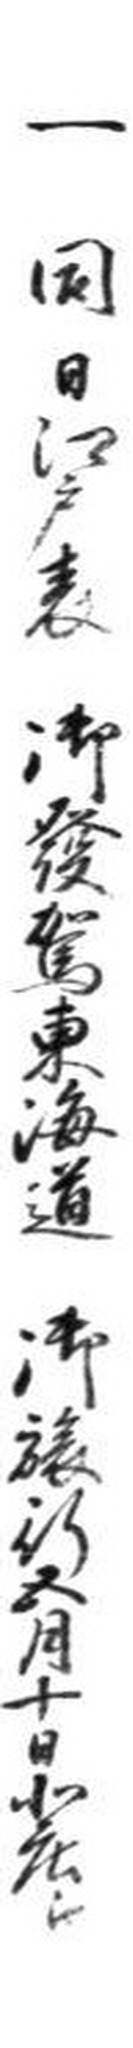一同日江戸表御発駕東海道御旅行五月十日北庄江
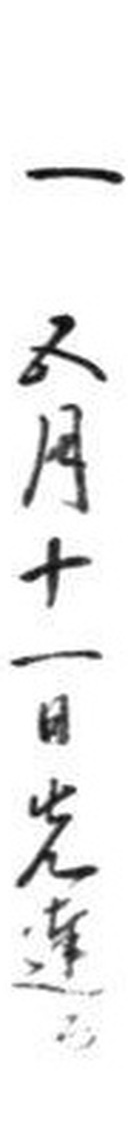一五月十一日先達而
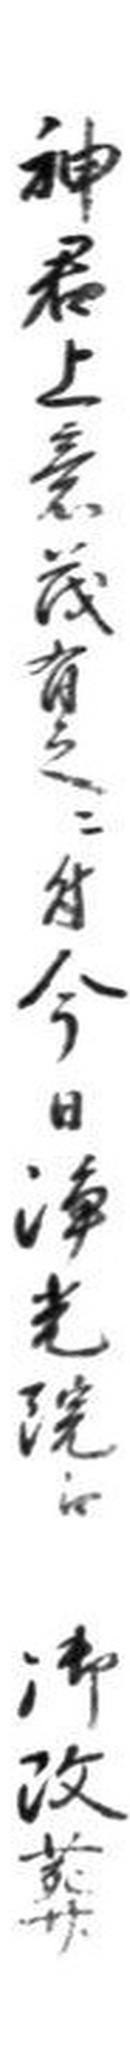神君上意茂有之ニ付今日浄光院江御改葬
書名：家譜 二 忠直公 従文禄四年到慶安四年
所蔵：福井県文書館 Fukui Prefectural Archives
